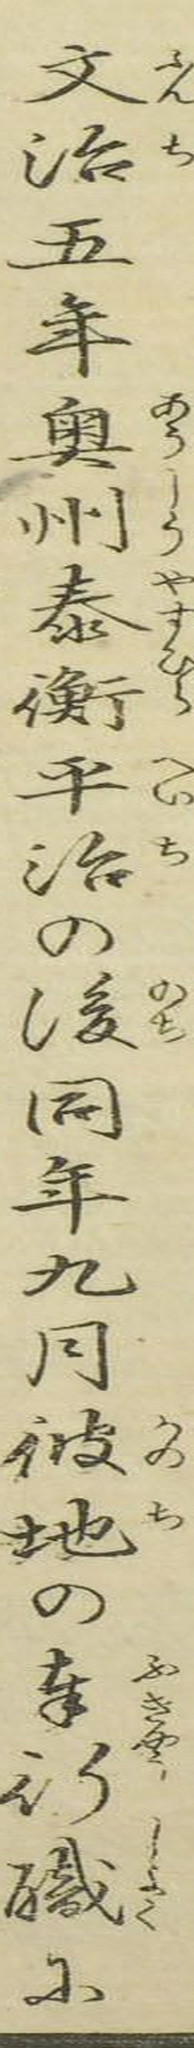文治五年奥州泰衡平治の後同年九月彼地の奉行職に
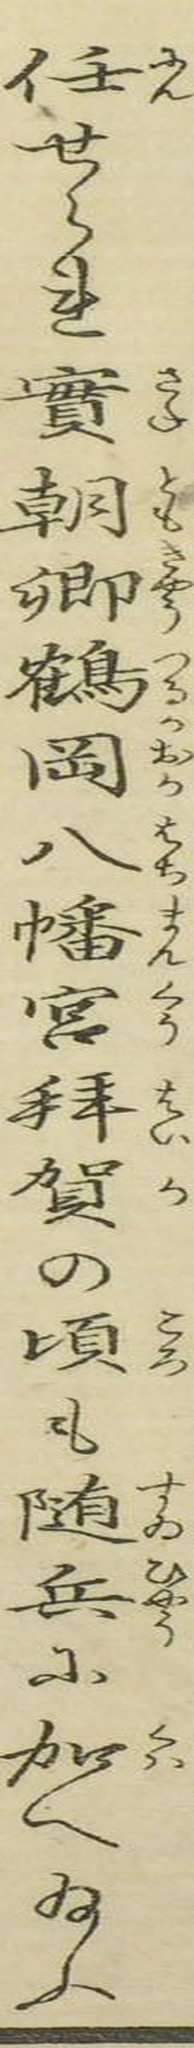任せられ実朝卿鶴岡八幡宮拝賀の頃も随兵に加へ給ふ
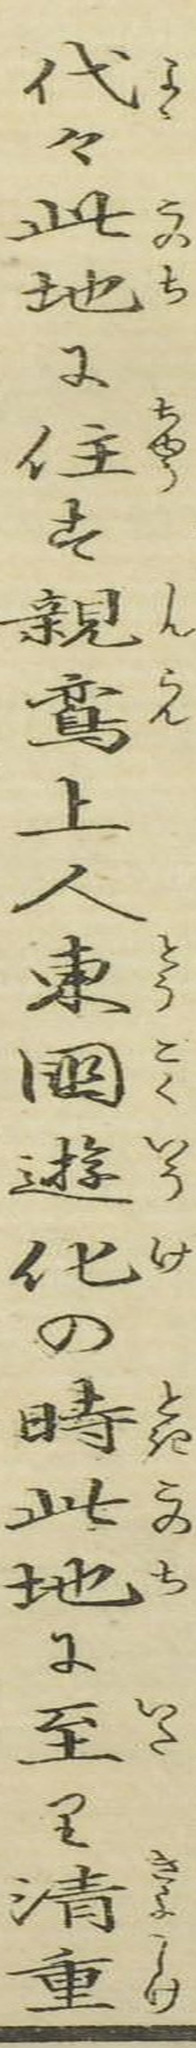代々此地に住す親鸞上人東国遊化の時此地に至り清重
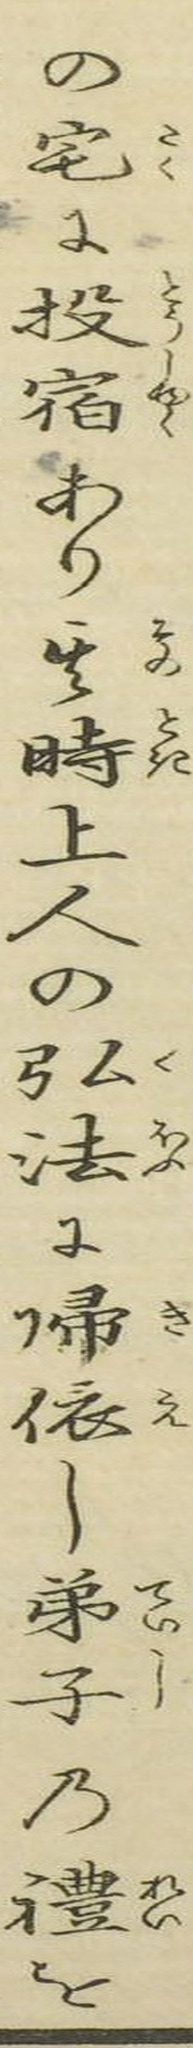の宅に投宿あり其時上人の弘法に帰依し弟子の礼を
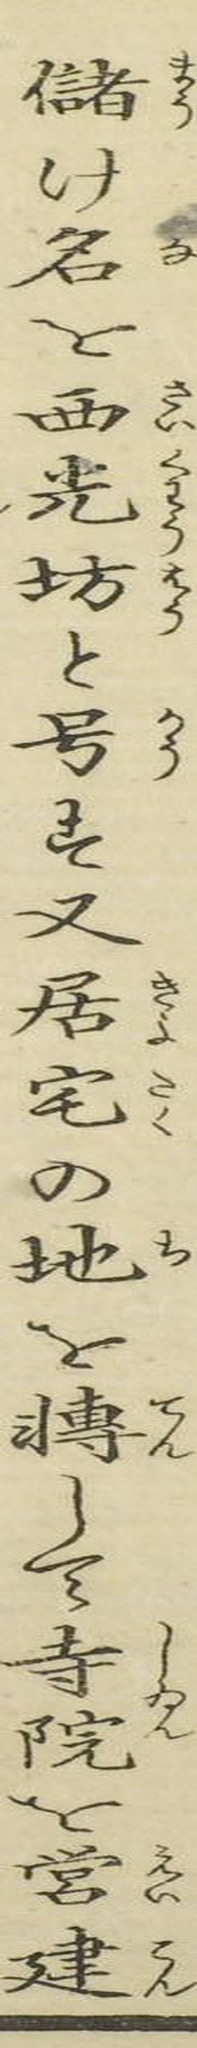儲け名を西光坊と号す又居宅の地を転して寺院を営建
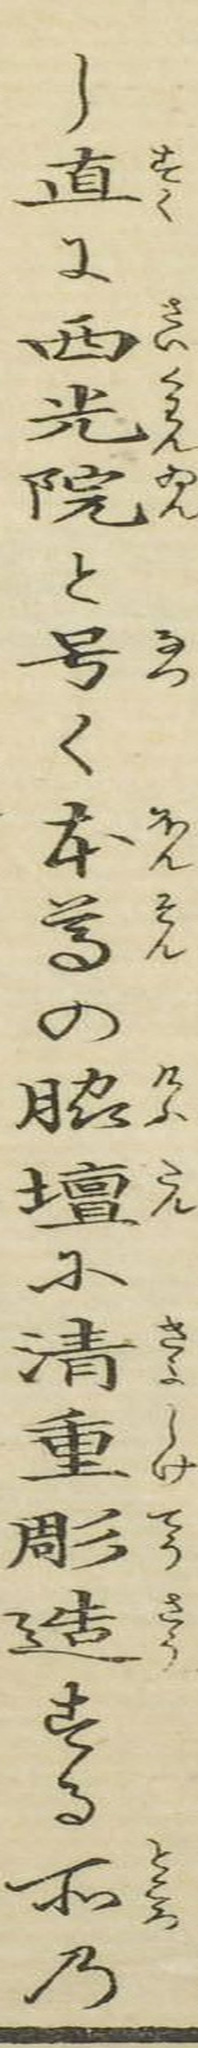し直に西光院と号く本尊の脇壇に清重彫造する所の
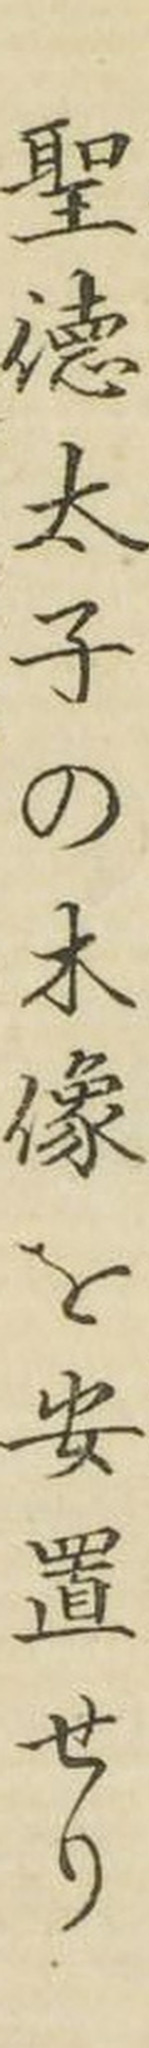聖徳太子の木像を安置せり
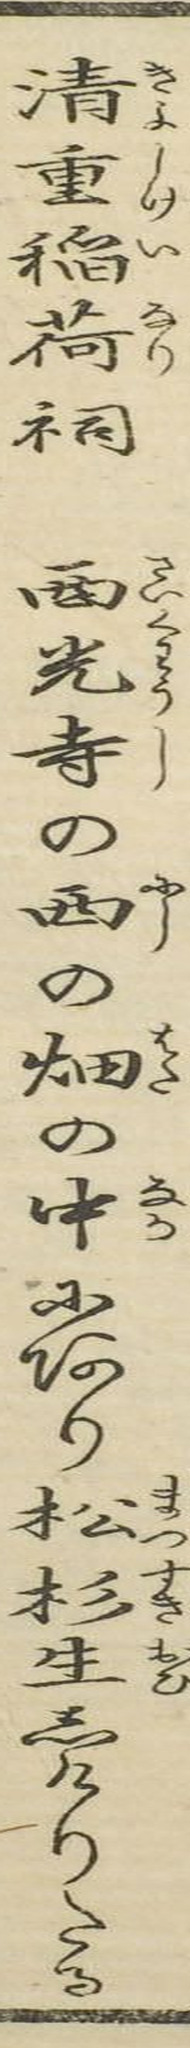清重稲荷祠西光寺の西の畑の中にあり松杉生しけりたる
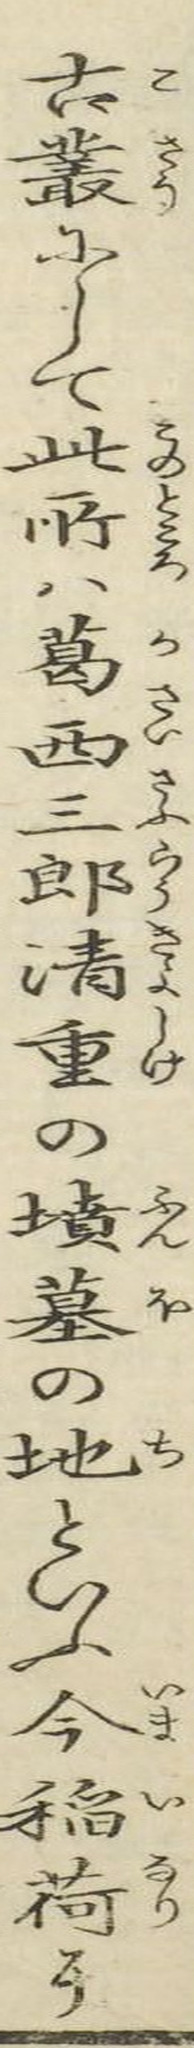古叢にして此所は葛西三郎清重の墳墓の地といふ今稲荷を
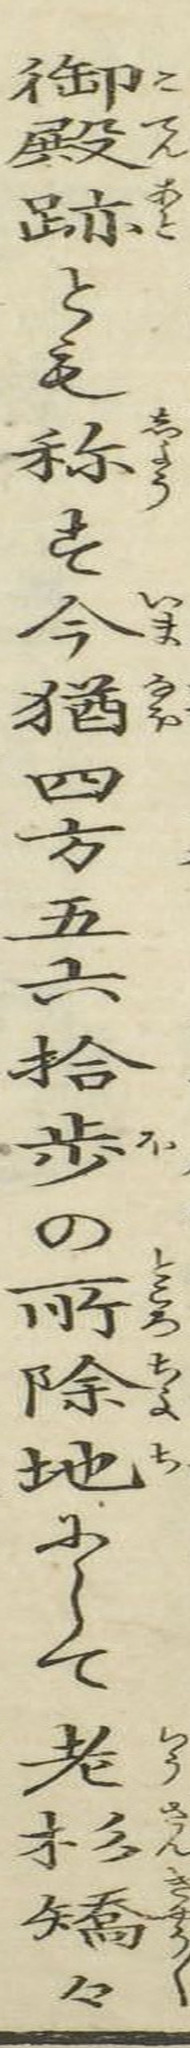御殿跡とも称す今猶四方五六歩の所除地にして老杉矯々
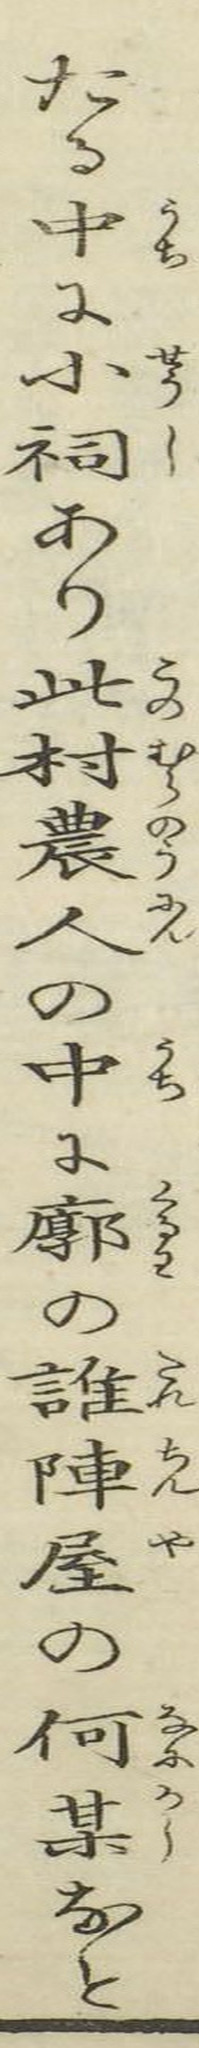たる中に小祠あり此村農人の中に廓の誰陣屋の何某なと
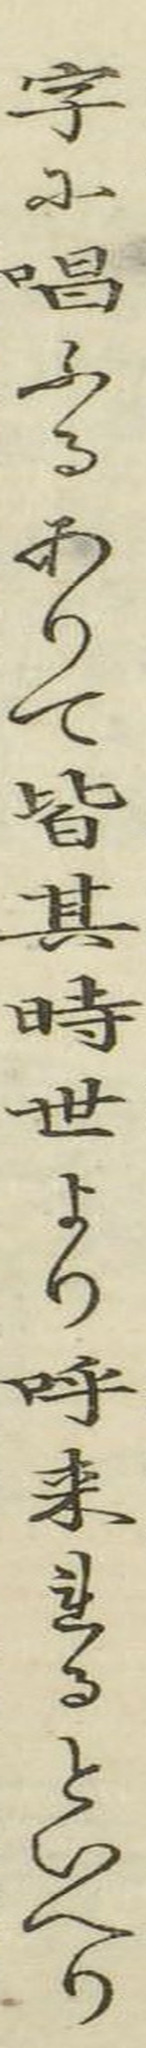字に唱ふるありて皆其時世より呼来れるといへり

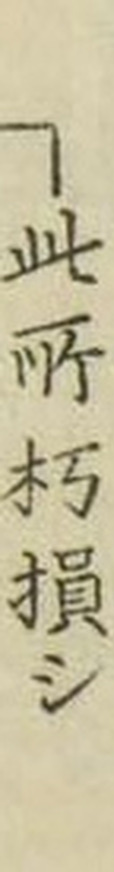此所朽損シ
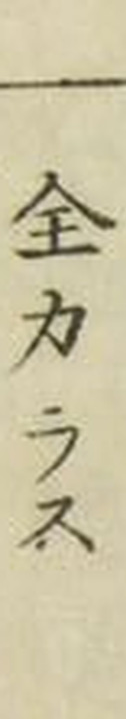全カラス
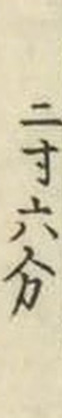二寸六分
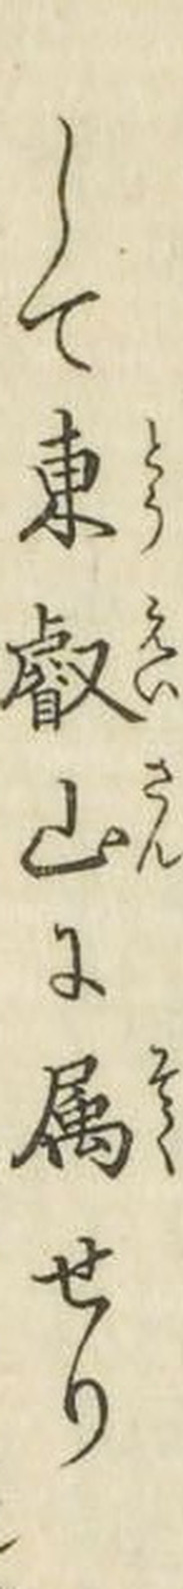して東叡山に属せり
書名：江戸名所図会 20巻 巻之19
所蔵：東京学芸大学教育コンテンツアーカイブ
